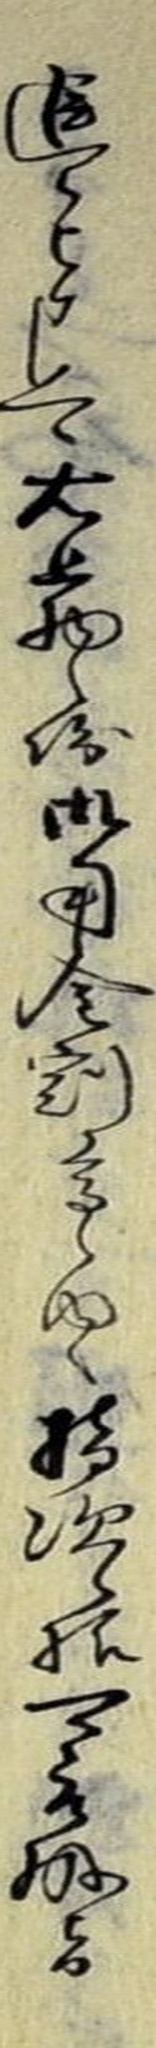追々被申上候右上物之儀御用金割高之内へ指次候様可取扱旨
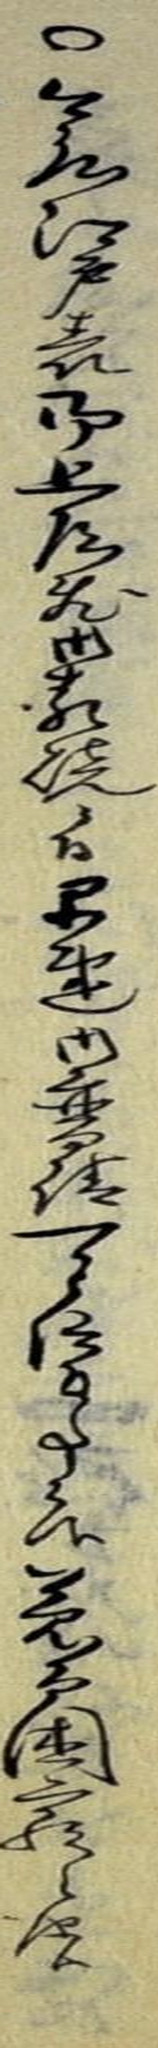〇今度江戸表御上屋敷御類焼に付早速御普請可被仰付事に候兼而困窮之儀は
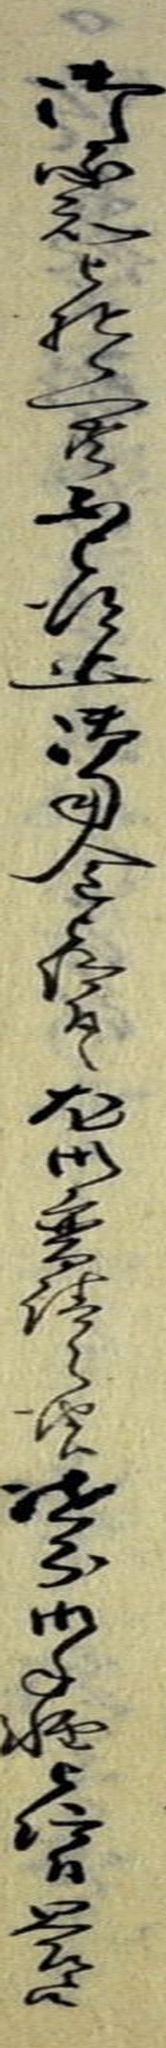御承知被遊候へ共不被得止御用金被仰付候尤御普請之儀は随分御手軽被仰付思召に候
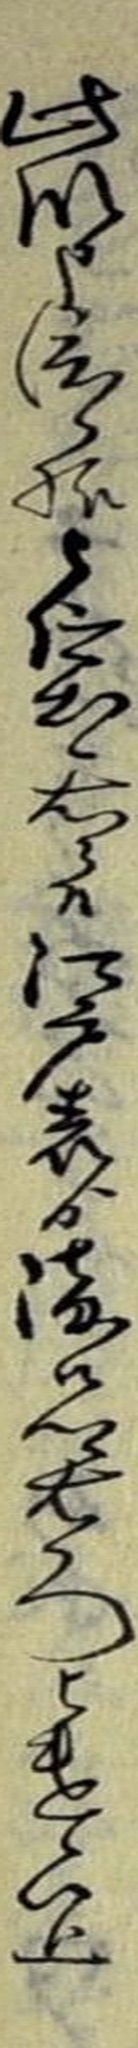此段申渡候様被仰出候右に付江戸表ゟ溝口郷右衛門被遣候以上
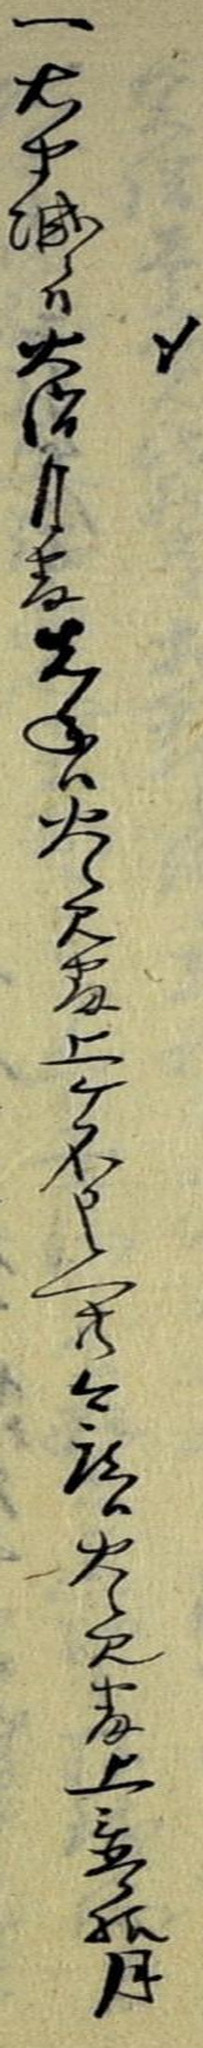一右半減に付火消月番先年は火之見番上ケ不申候へ共今度は火之見番上置候様月
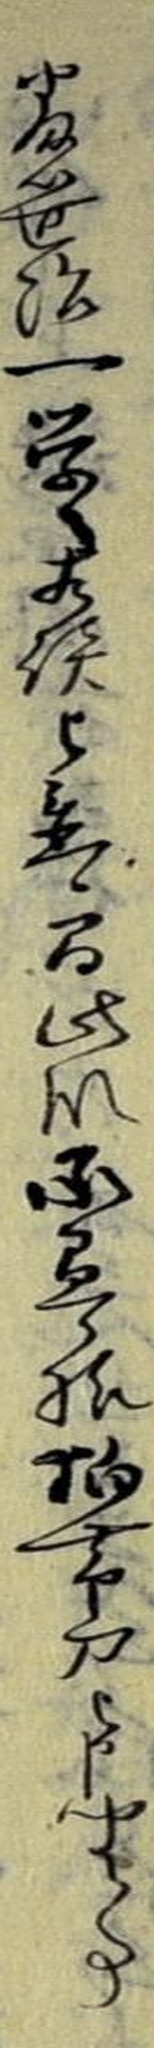番笹治一学へ相談被置候間此段承置候様狛帯刀被申聞候事
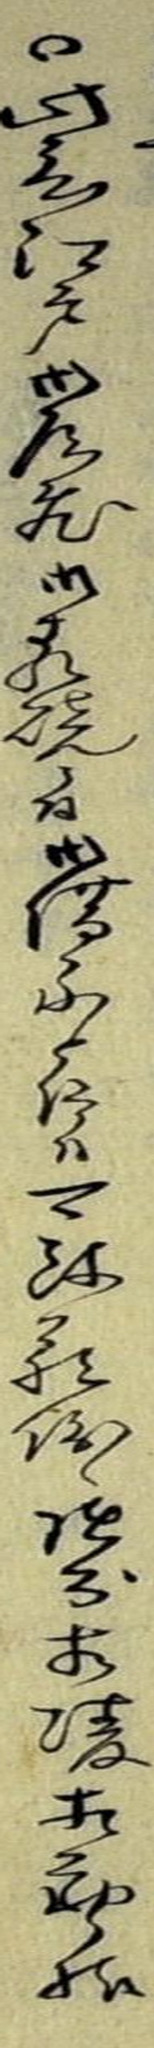〇此度江戸御屋敷御類焼に付御借米被仰付可致難儀候随分相凌相勤候様
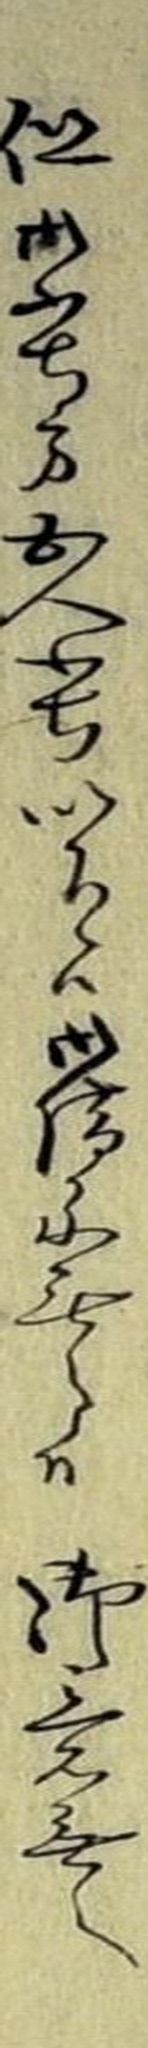但御ふち方五人ふち以下へは御借米無之に付御意無之
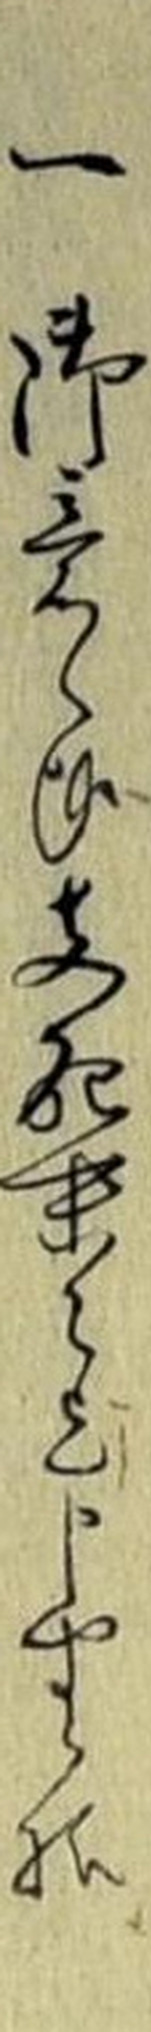一御意之趣支配末々迄申聞候様
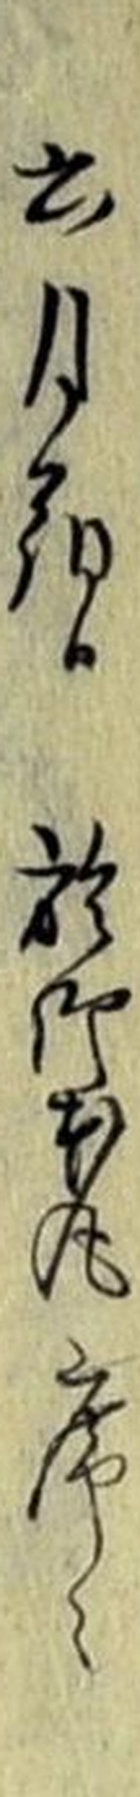六月朔日於御本丸席々
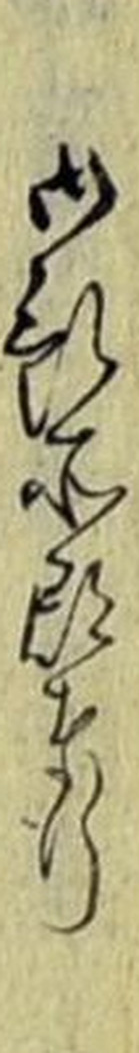御預所郡奉行
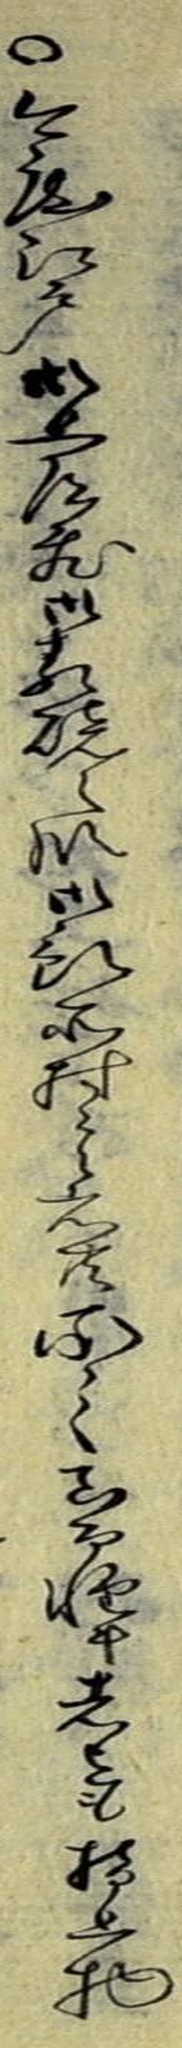〇今度江戸御上屋敷御類焼之段御預所村々之者共承之至而軽き者迄も指上物
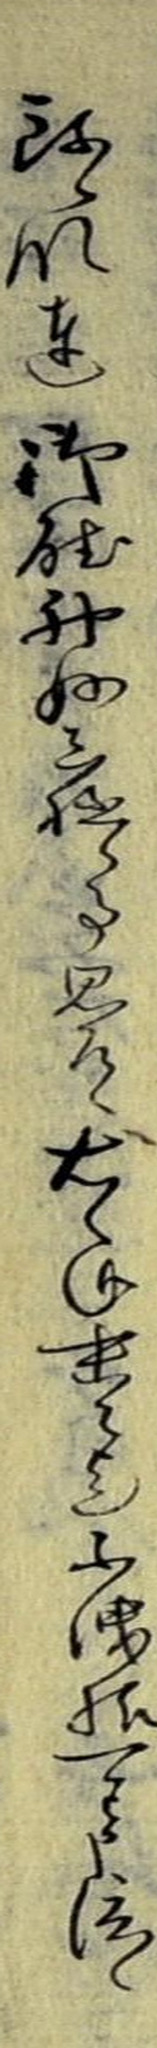致候段御聴神妙至極候事思召候右之趣末々迄不洩様可被申渡候
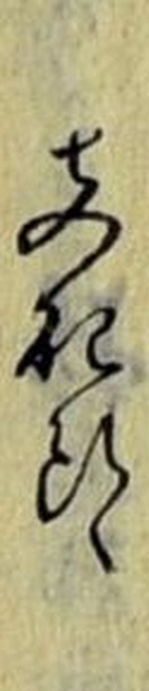支配頭へ

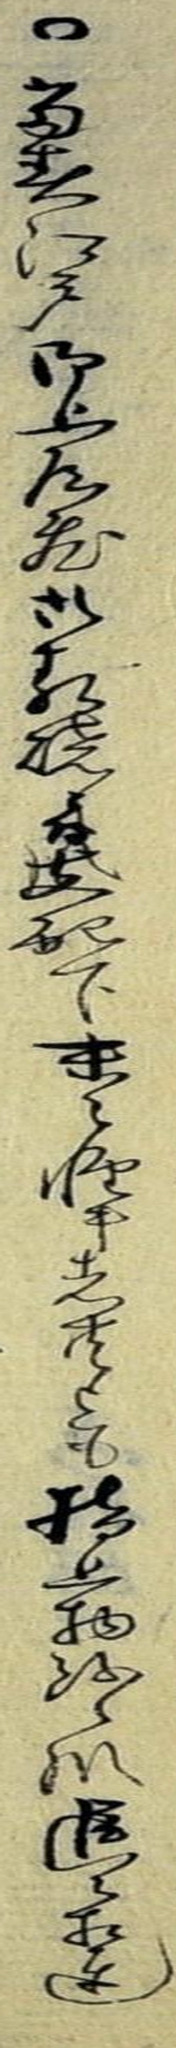〇当春江戸御上屋敷御類焼に付支配下末々軽き者共迄も指上物致候段追々相達
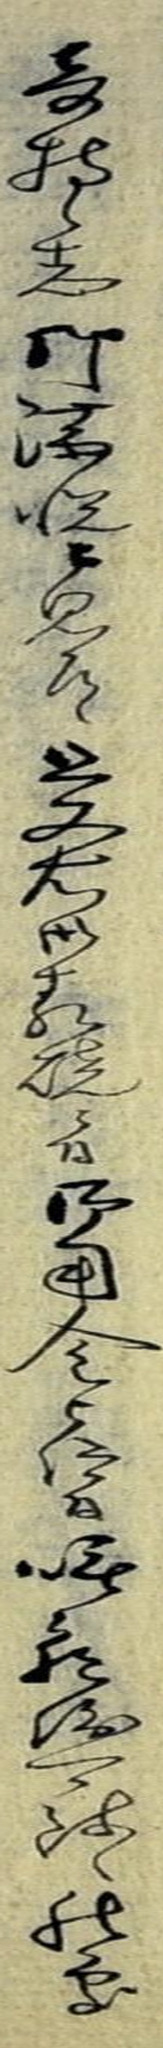奇特之志御満悦に思召候且又右御類焼に付御用金被仰付嘸難儀可致候然処
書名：命令之部 二
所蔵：福井県文書館 Fukui Prefectural Archives
